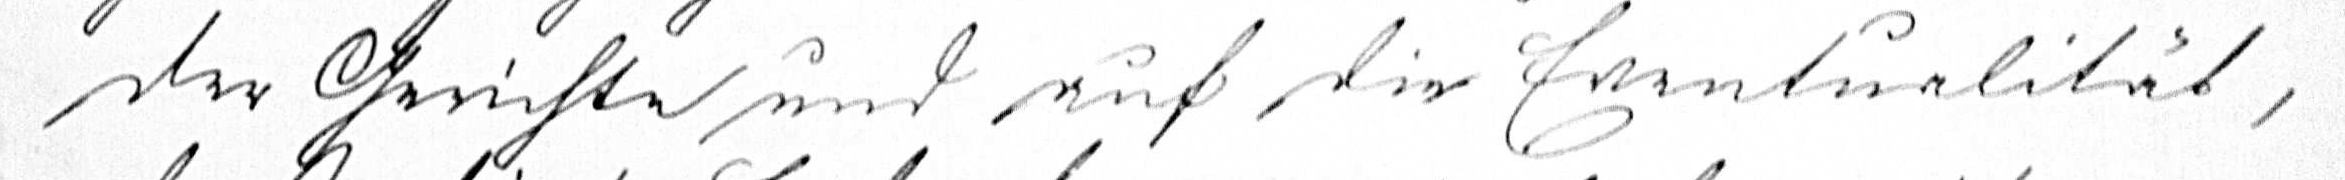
der Gerichte und auf die Eventualität,
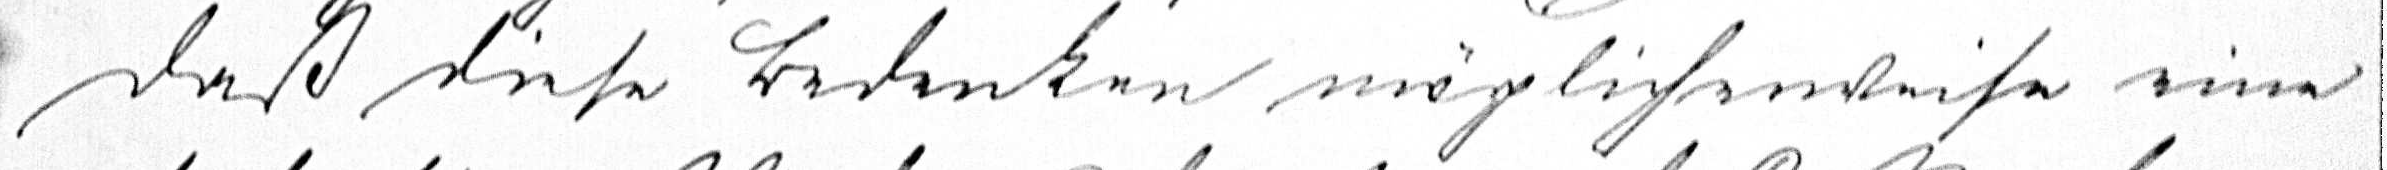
daß diese Bedenken möglicherweise eine
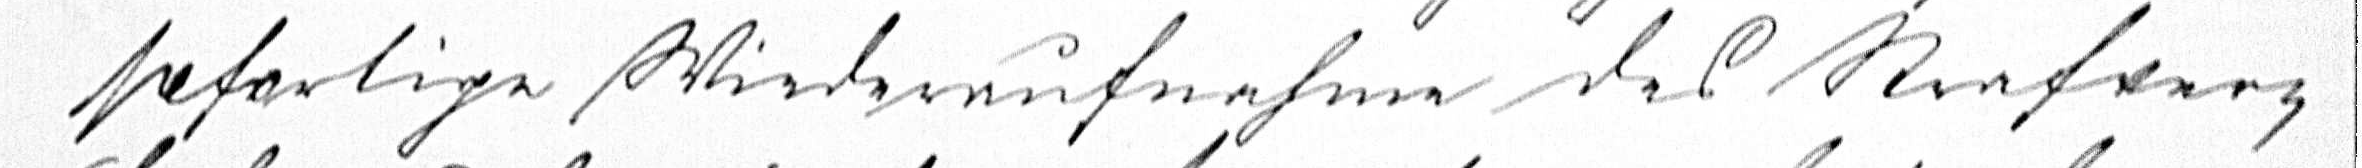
sofortige Wideraufnahme des Strafver¬
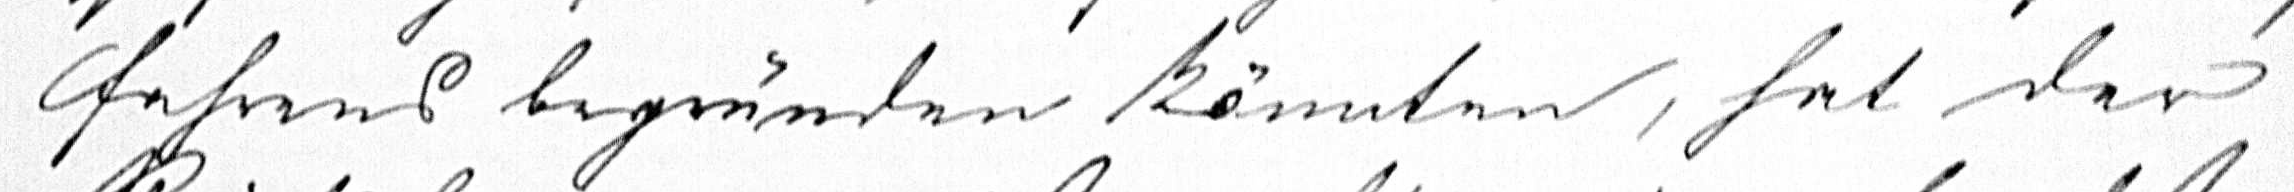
fahrens begründen könnten, hat der
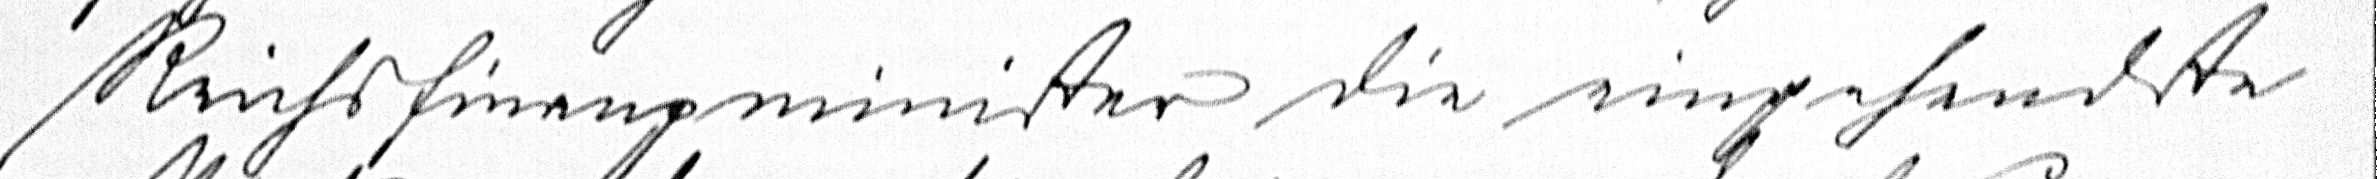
Reichsfinanzminister die eingehendste
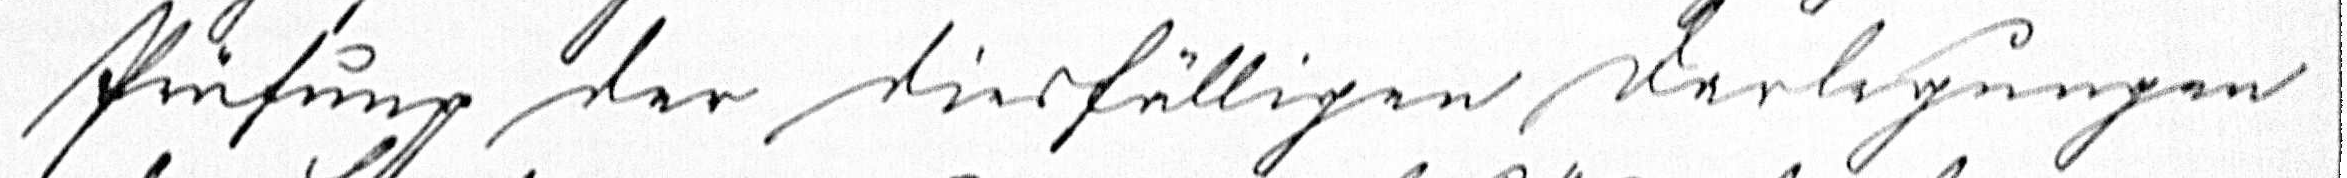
Prüfung der diesfälligen Darlegungen
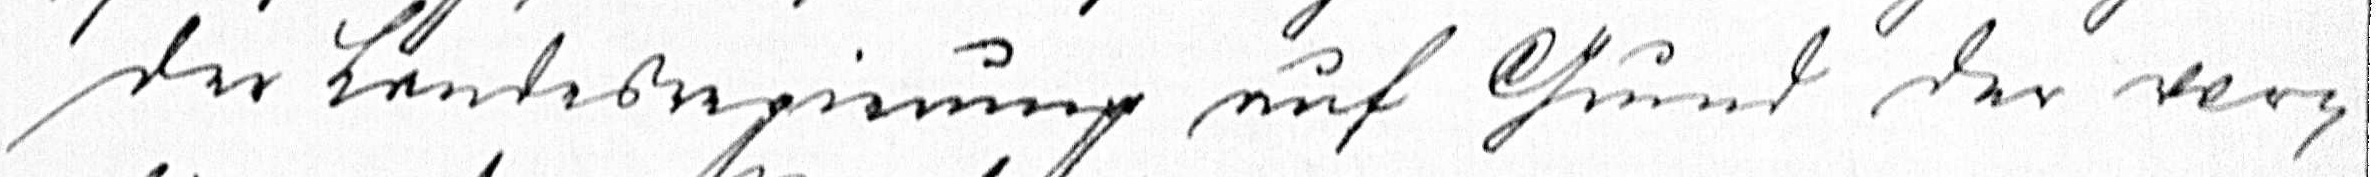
der Landesregierung auf Grund der vor¬
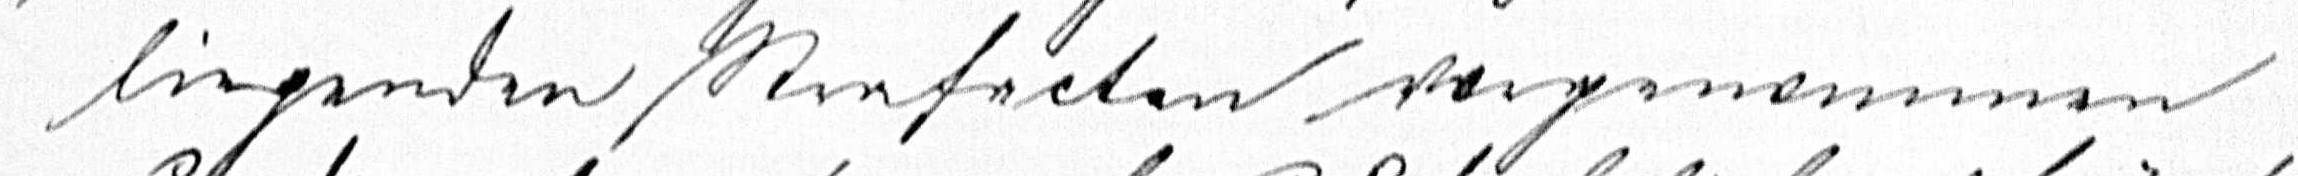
liegenden Strafacten vorgenommen
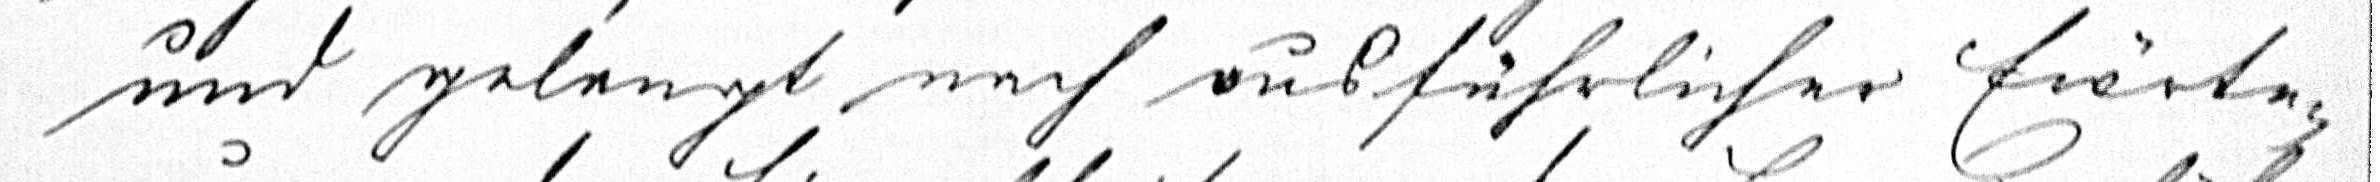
und gelangt nach ausführlicher Erörte¬
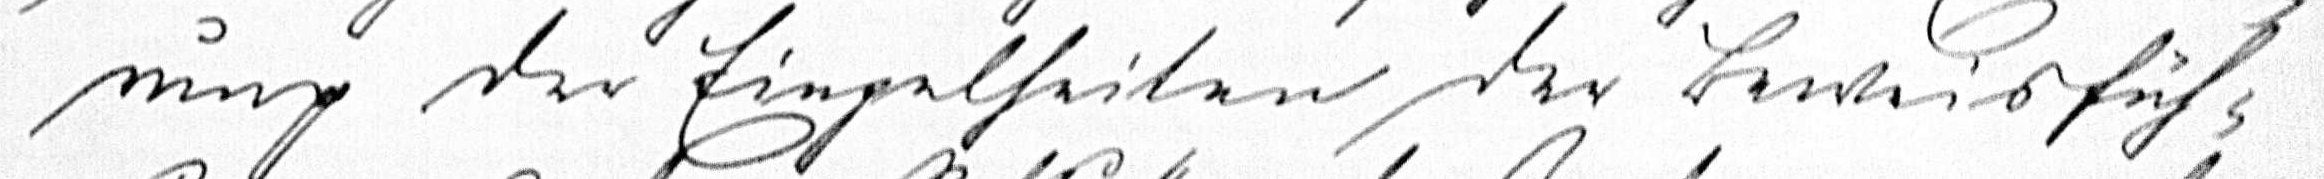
rung der Einzelheiten der Beweisfüh¬
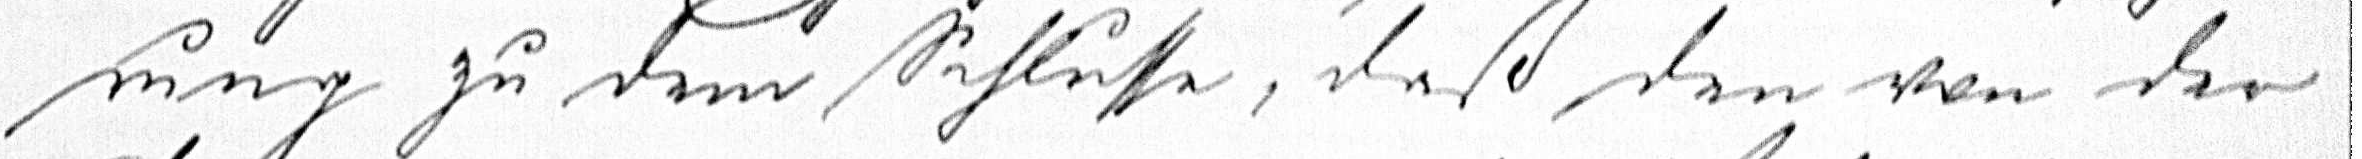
rung zu dem Schlusse, daß den von der
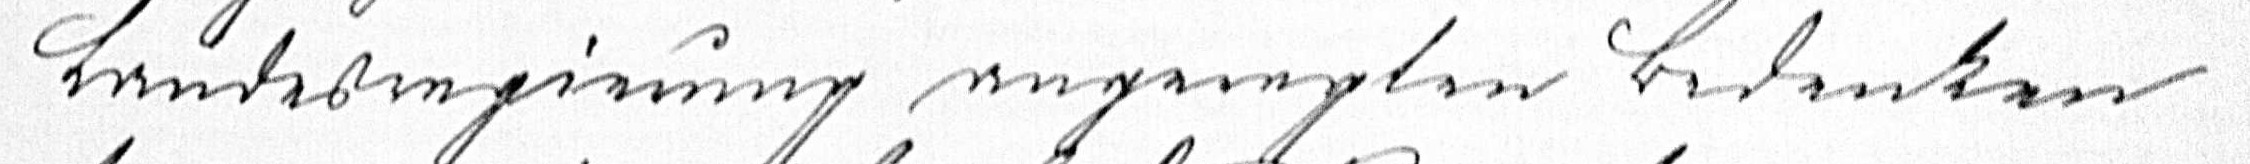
Landesregierung angeregten Bedenken
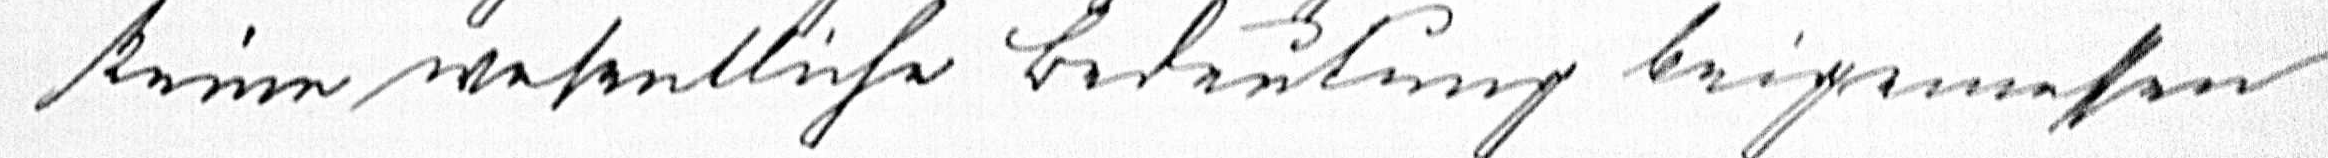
keine wesentliche Bedeutung beizumessen
